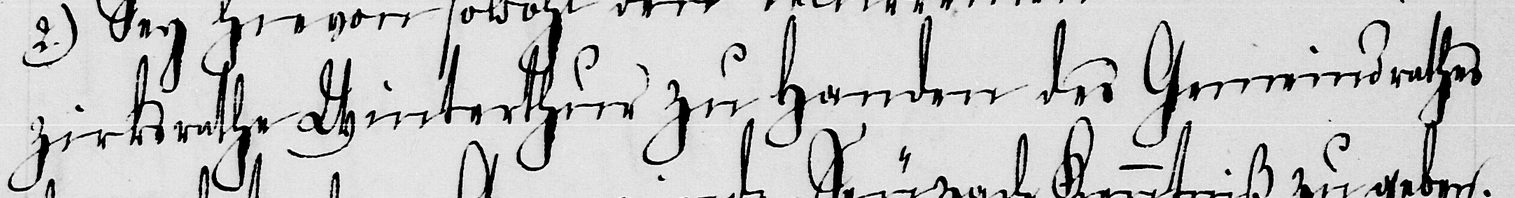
zirksrathe Winterthur zu Handen des Gemeindrathes
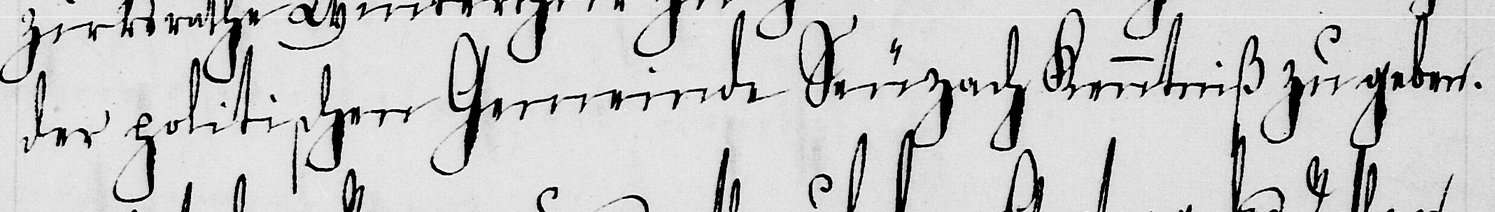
der politischen Gemeinde Seuzach Kenntniß zu geben.
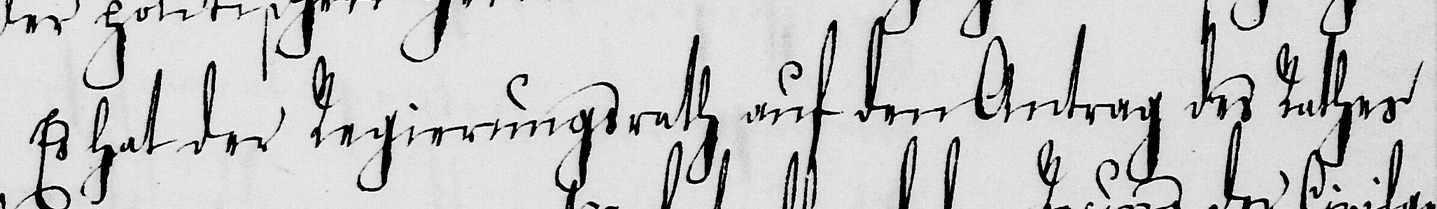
Es hat der Regierungsrath auf den Antrag des Rathes
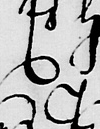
a.)
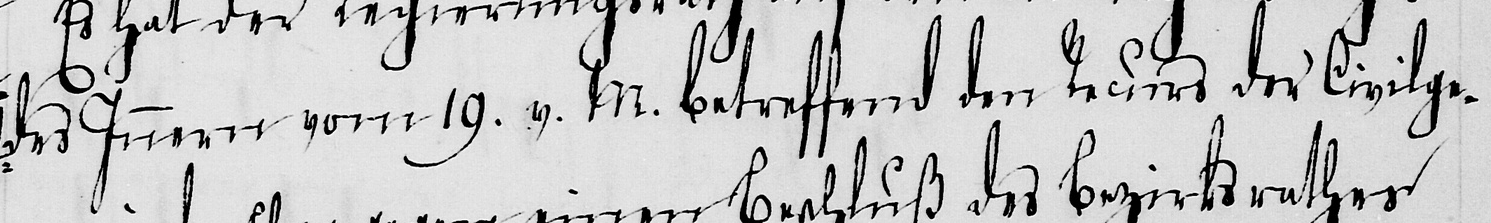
des Innern vom 19. v. M. betreffend den Recurs der Civilge¬
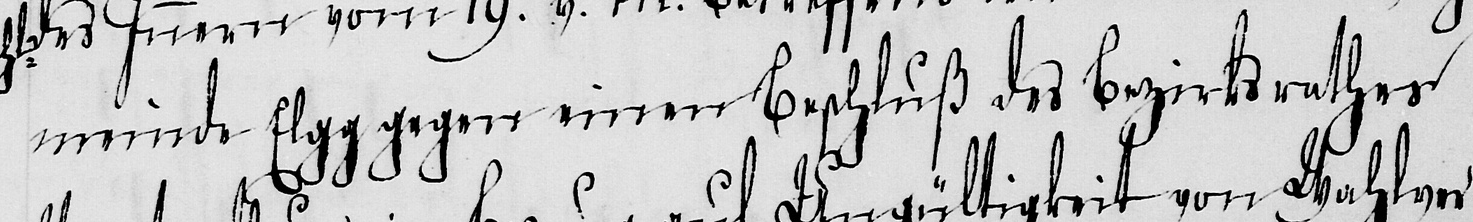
meinde Elgg gegen einen Beschluß des Bezirksrathes
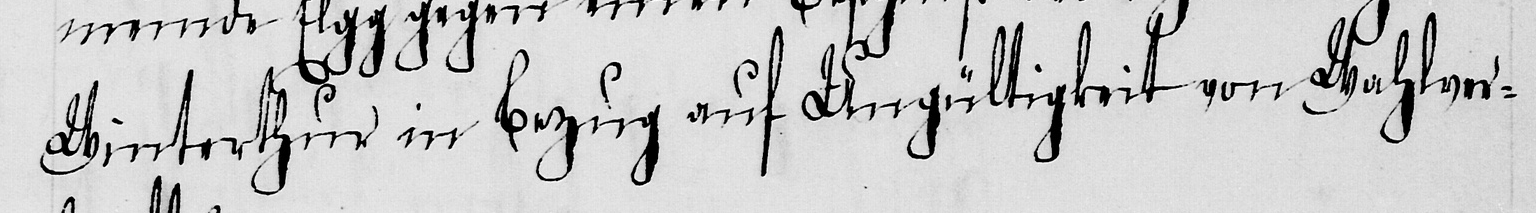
Winterthur in Bezug auf Ungültigkeit von Wahlver¬
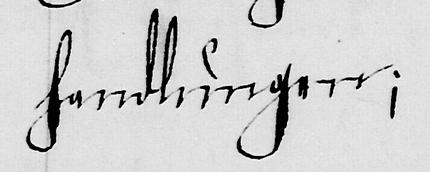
handlungen;
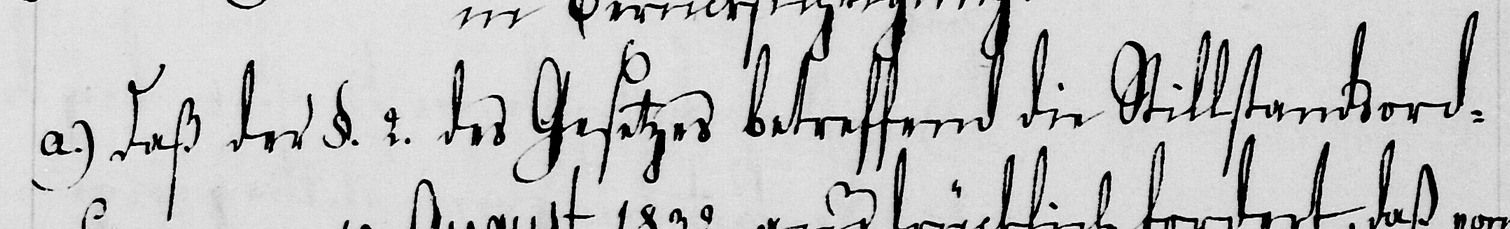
§. 2. des Gesetzes betreffend die Stillstandsord¬
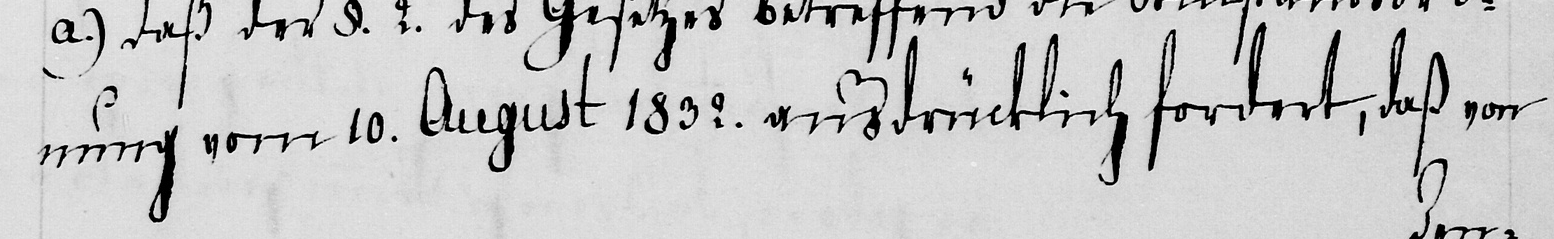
nung vom 10. August 1832. ausdrücklich fordert, daß von
